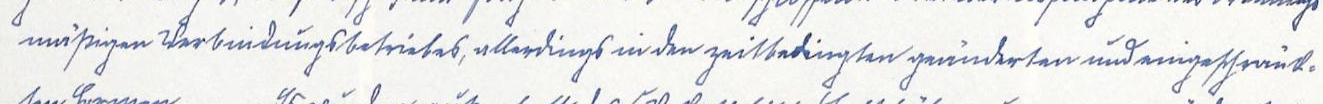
mäßigen Verbindungsbetriebes, allerdings in den zeitbedingten geänderten und eingeschränk-
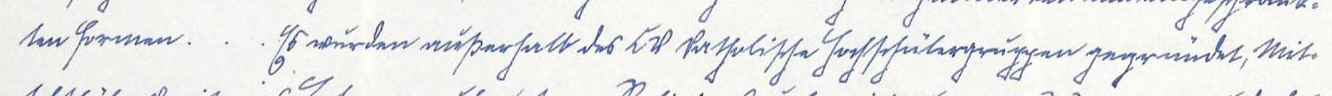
ten Formen... Es wurden außerhalb des CV katholische Hochschülergruppen gegründet, Mit-
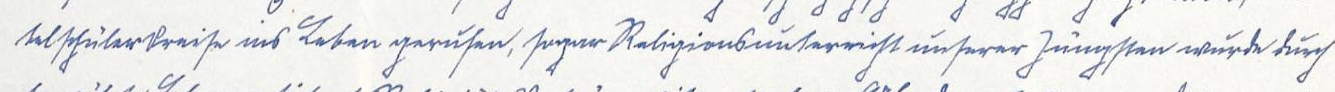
telschülerkreise ins Leben gerufen, sogar Religionsunterricht unserer Jüngsten wurde durch
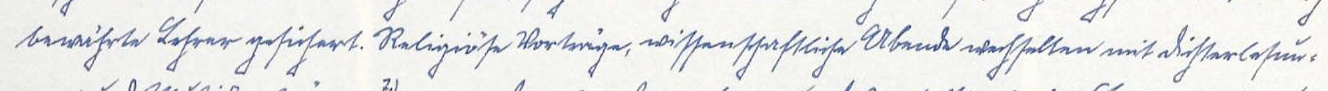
bewährte Lehrer gesichert. Religiöse Vorträge, wissenschaftliche Abende wechselten mit Dichterlesun-
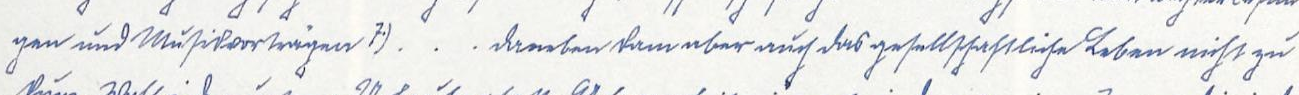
gen und Musikvorträgen 7) ... Daneben kam aber auch das gesellschaftliche Leben nicht zu
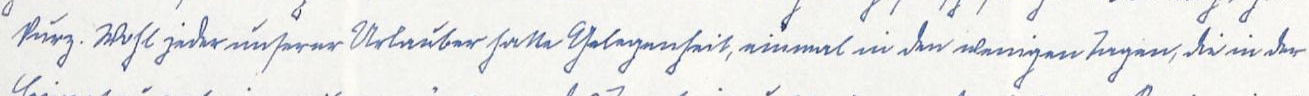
kurz. Wohl jeder unserer Urlauber hatte Gelegenheit, einmal in den wenigen Tagen, die in der
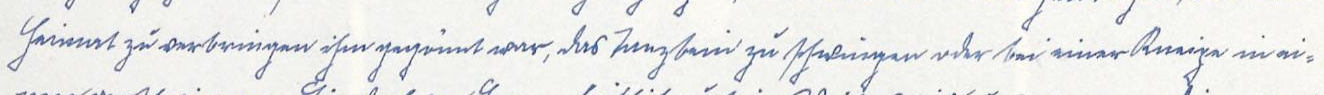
Heimat zu verbringen ihm gegönnt war, das Tanzbein zu schwingen oder bei einer Kneipe in ein-
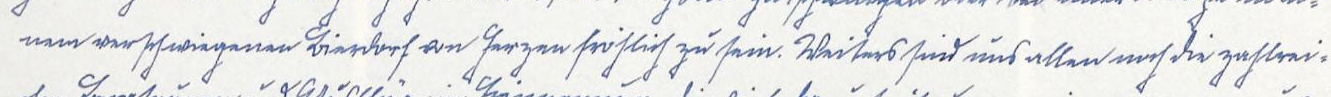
nem verschwiegenen Bierdorf von Herzen fröhlich zu sein. Weiters sind uns allen noch die zahlrei-
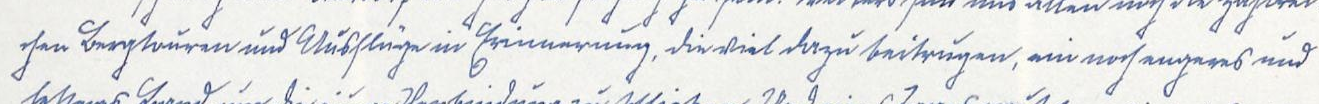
chen Bergtouren und Ausflüge in Erinnerung, die viel dazu beitrugen, ein noch engeres und
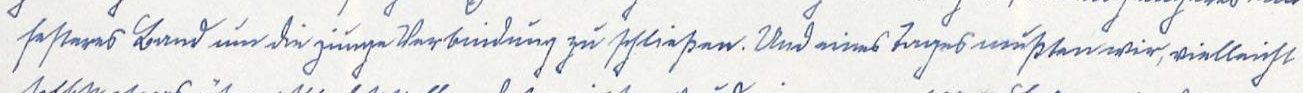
festeres Band um die junge Verbindung zu schließen. Und eines Tage mußten wir, vielleicht
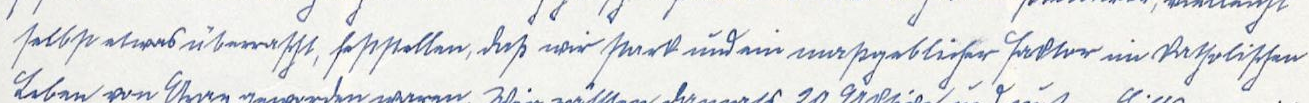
selbst etwas überrascht, feststellen, daß wir stark und ein maßgeblicher Faktor im katholischen
